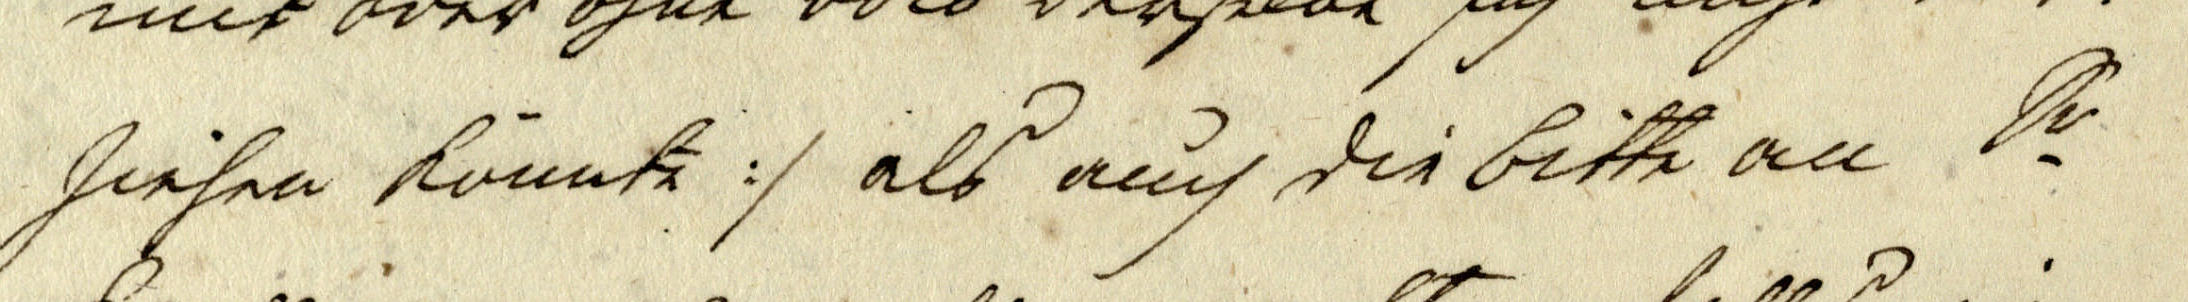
ziehen könnte :/ als auch die Bitte an Sr.
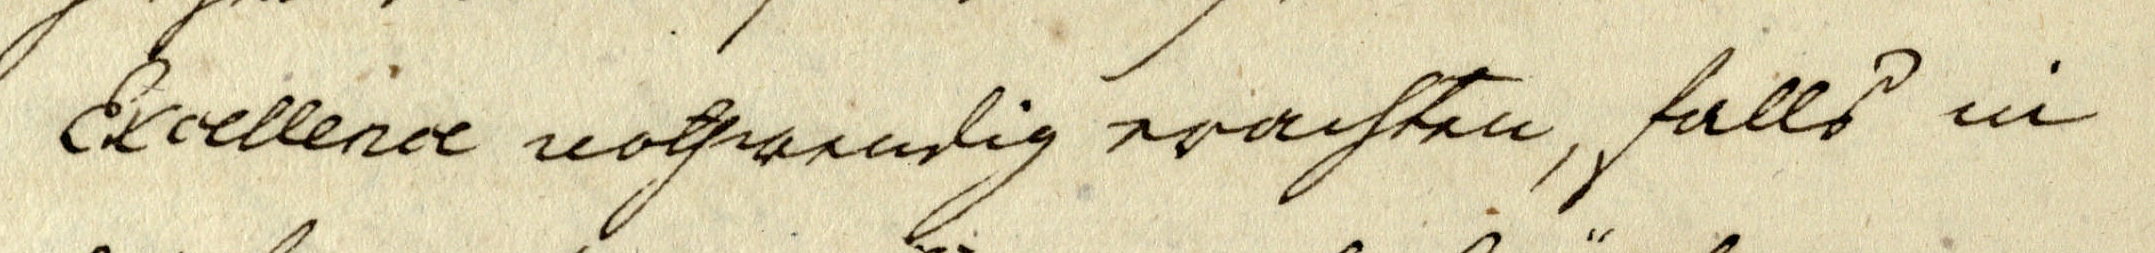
Excellence nothwendig erachten, falls in
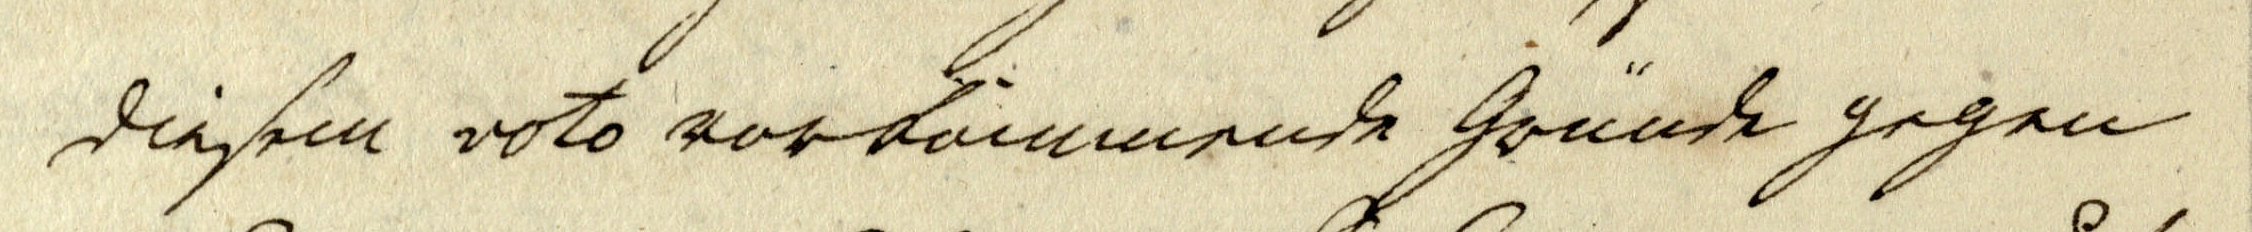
diesem voto vorkommende Gründe gegen
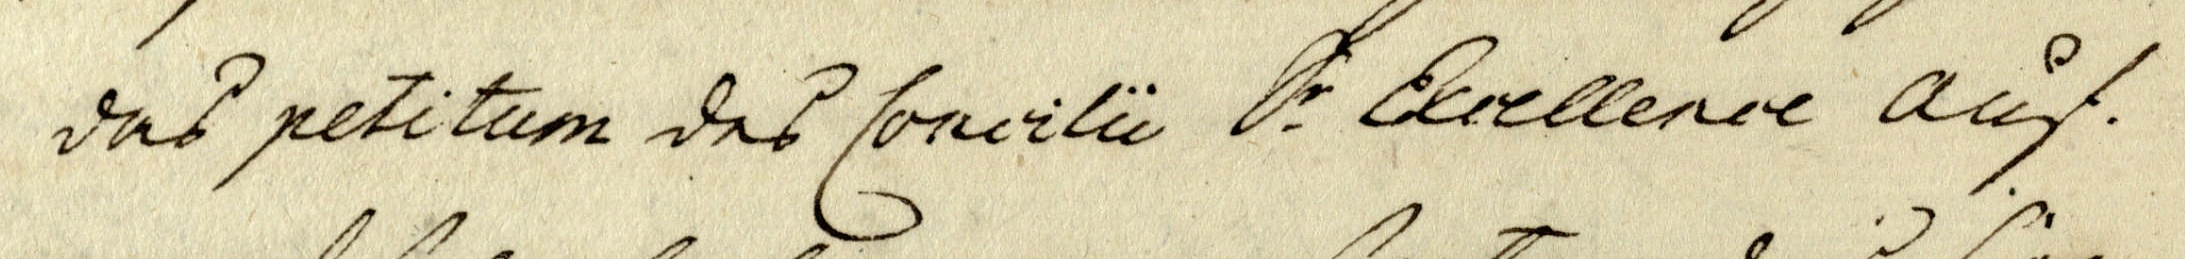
das petitum des Concilii Sr. Excellence Auf¬
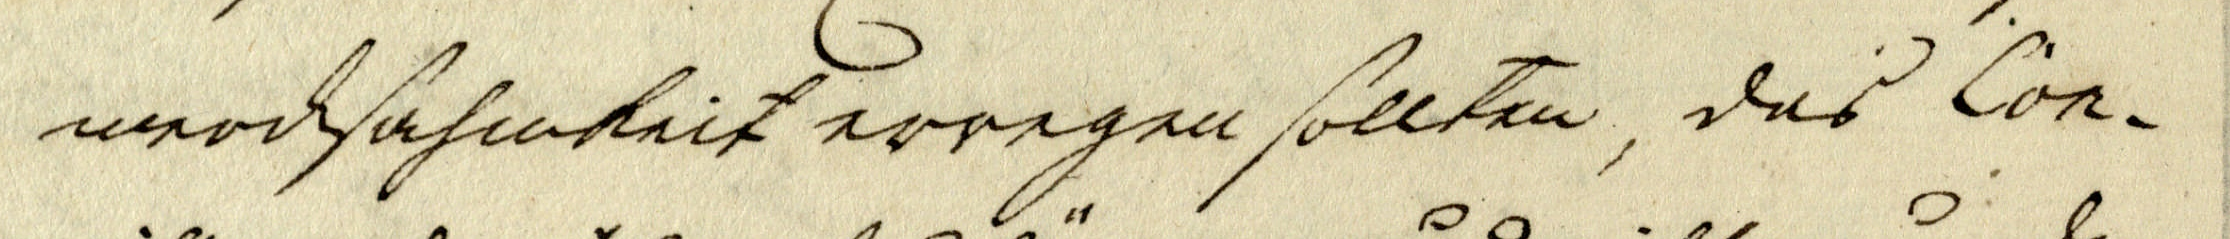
mercksahmkeit erregen sollten, das Con¬
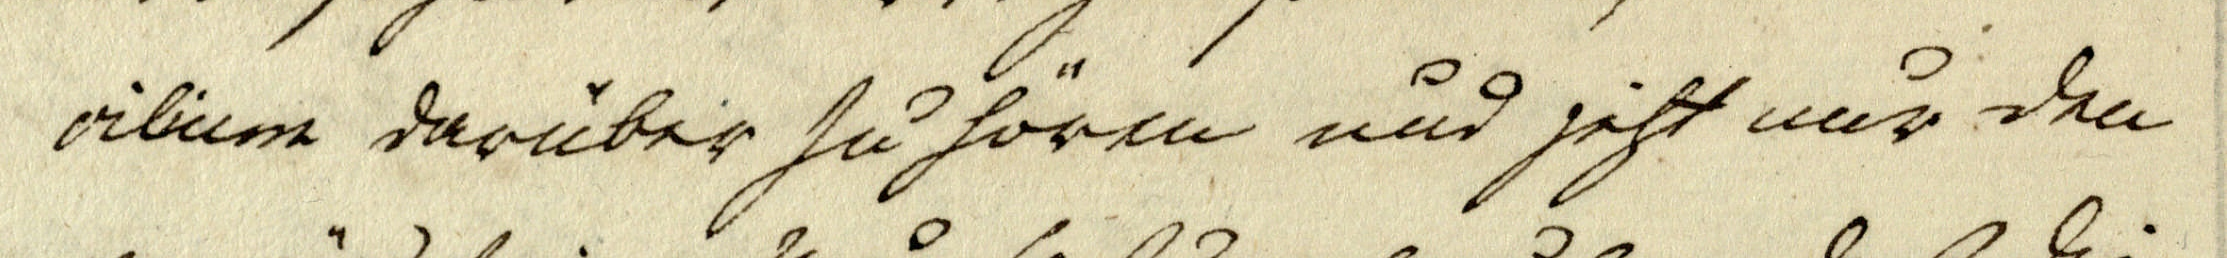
cilium darüber zu hören und jetzt nur den
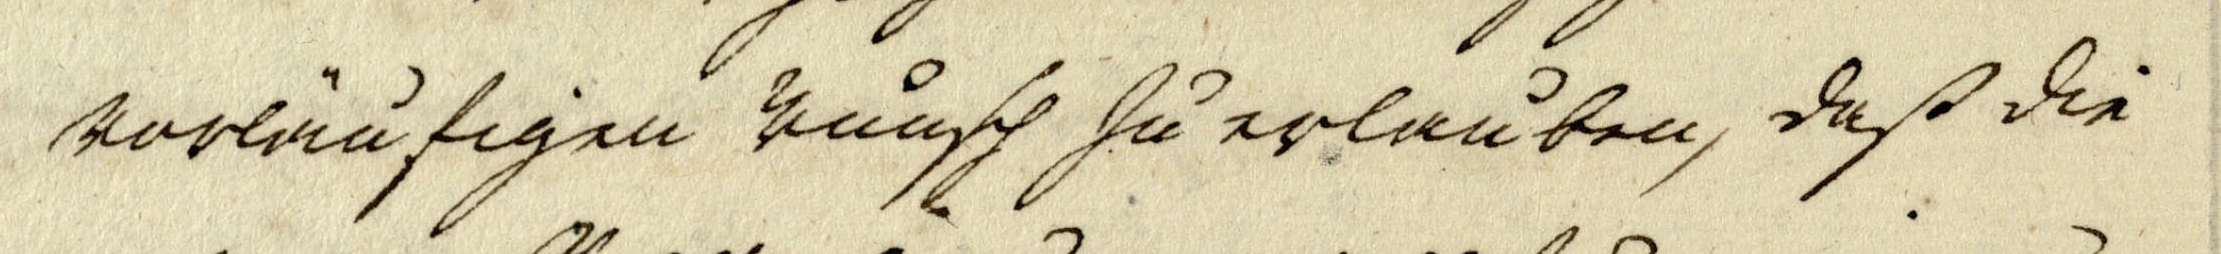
vorläufigen Wunsch zu erlauben, daß die
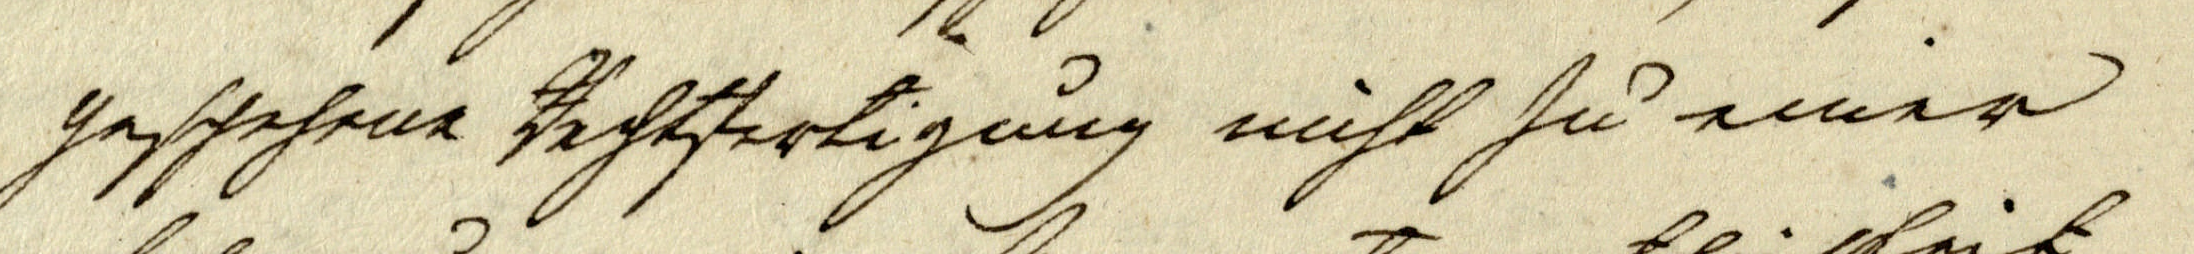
geschehene Rechtfertigung nicht zu einer
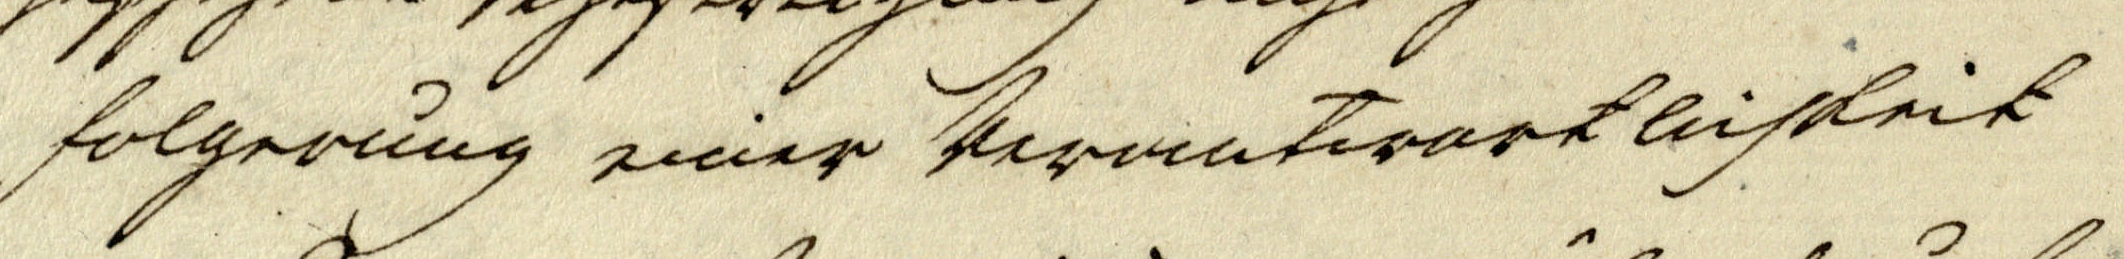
Folgerung einer Verantwortlichkeit
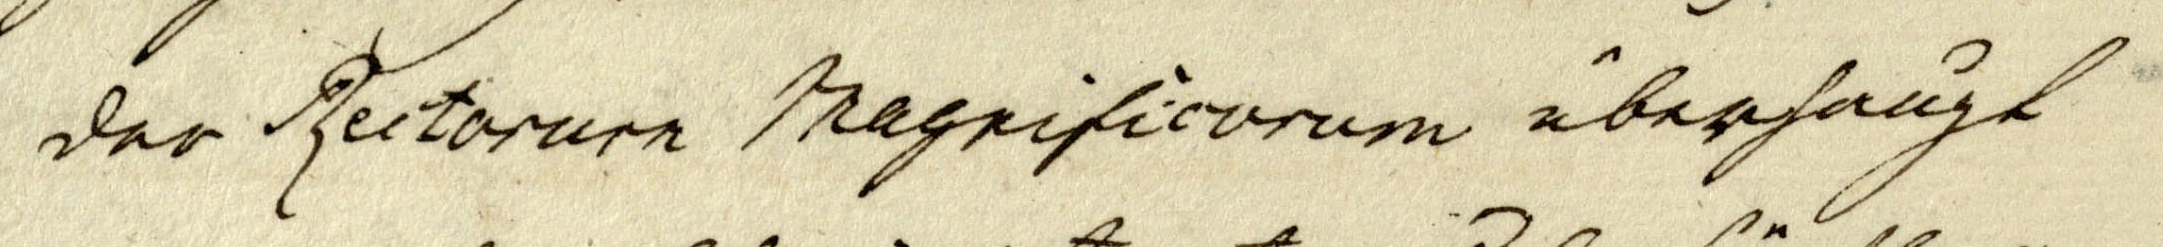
der Rectorum Magnificorum überhaupt
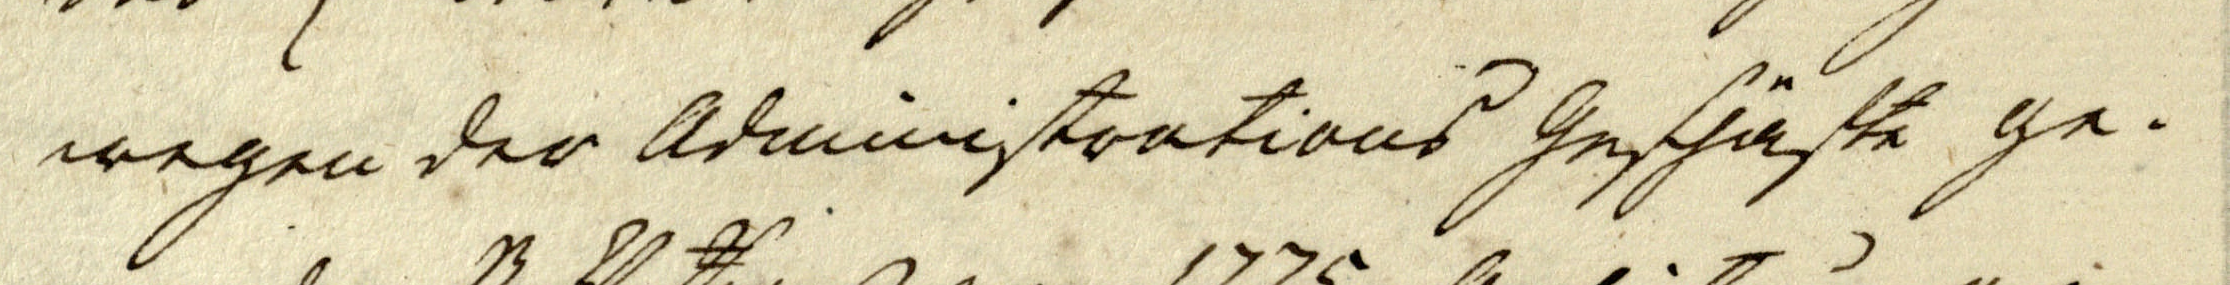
wegen der Administrations Geschäfte ge¬
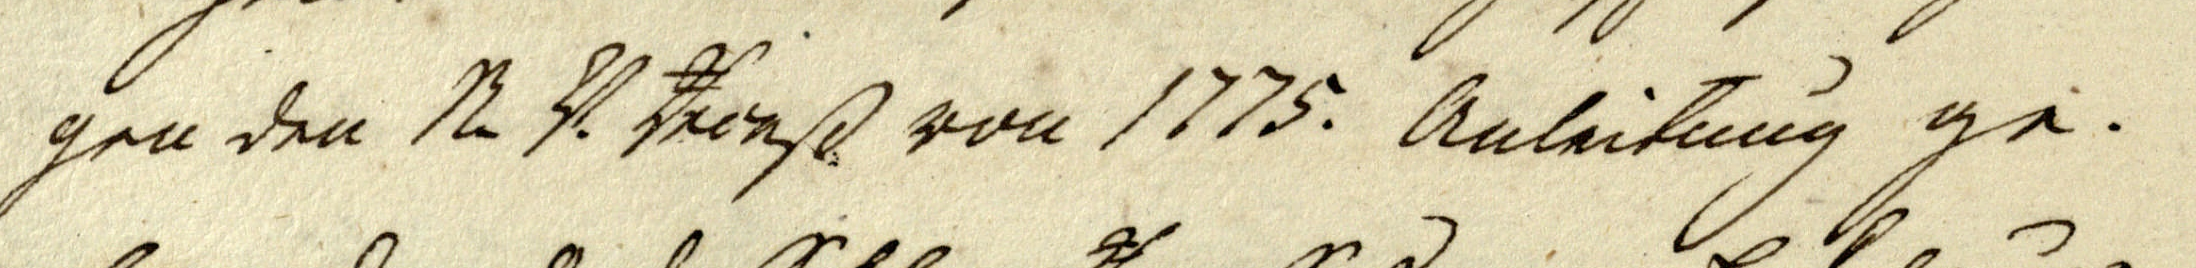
gen den N. V. Receß von 1775. Anleitung ge¬
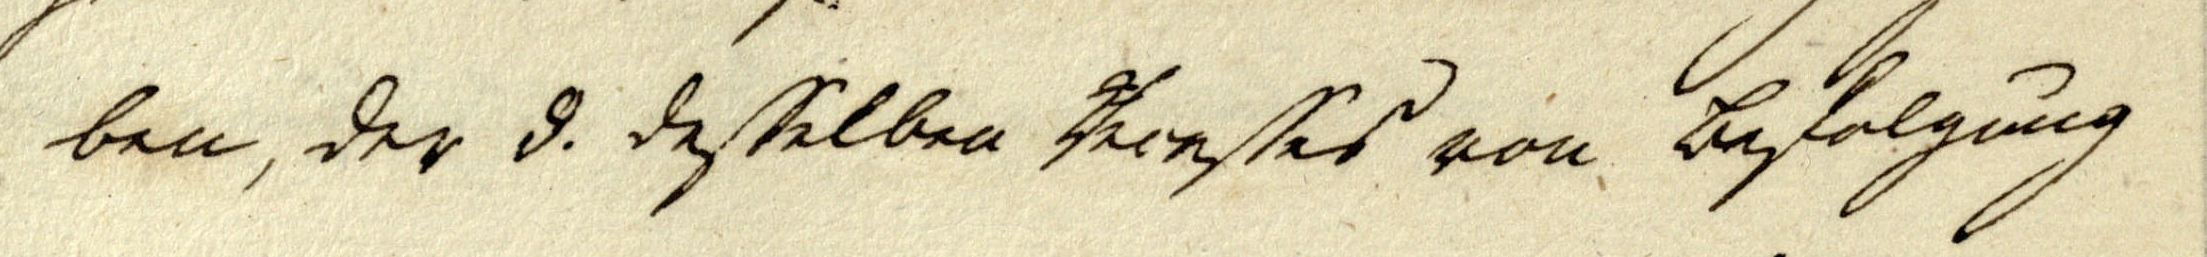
ben, der §. desselben Recesses von Befolgung
